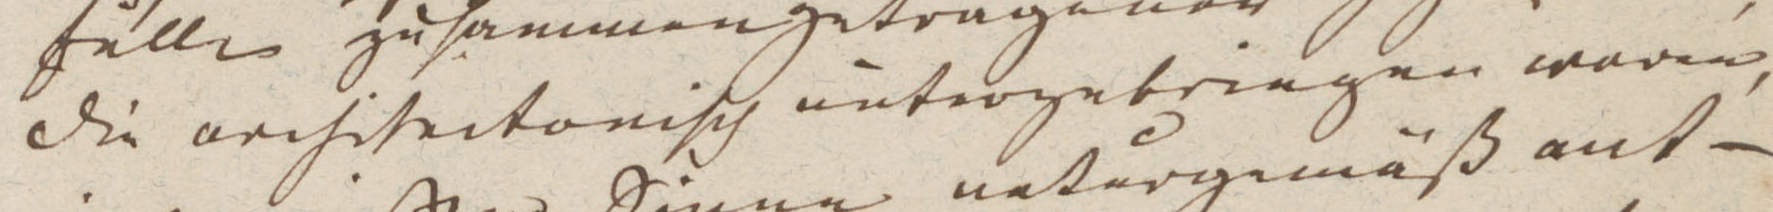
die architectonisch unterzubringen waren,
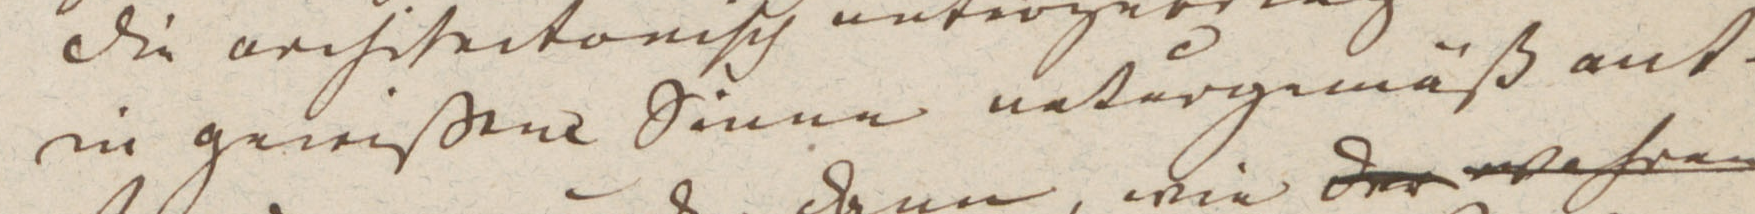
in gewissenm Sinne naturgemäss ent-
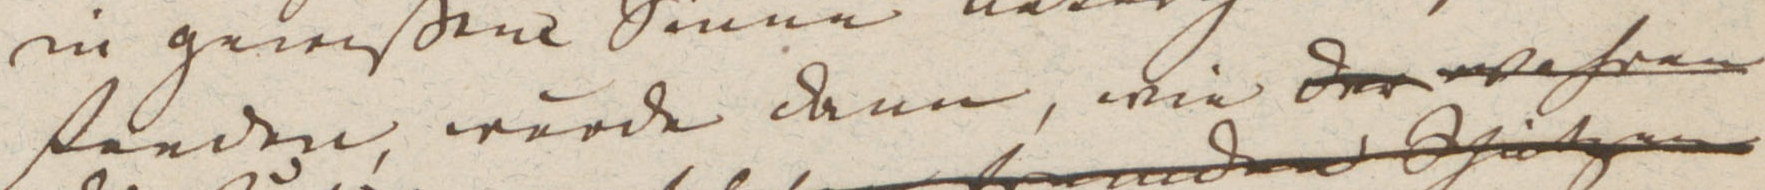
standen, wurde dann, wie der wahren
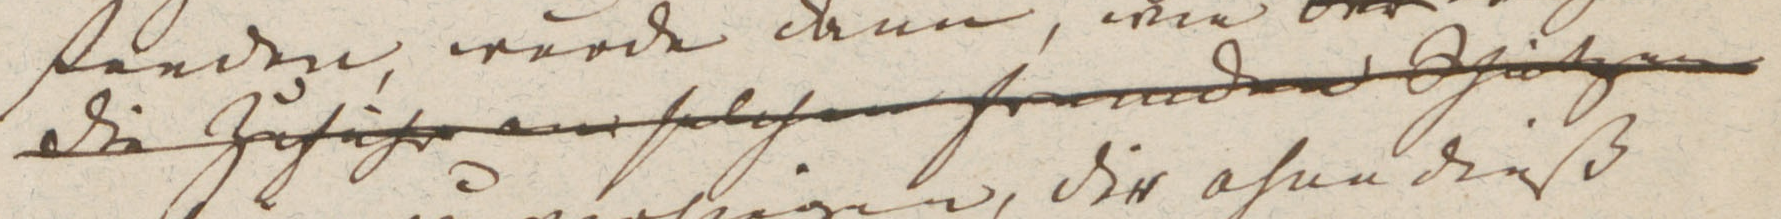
die Zufuhr aus solchen fremden Schätzen
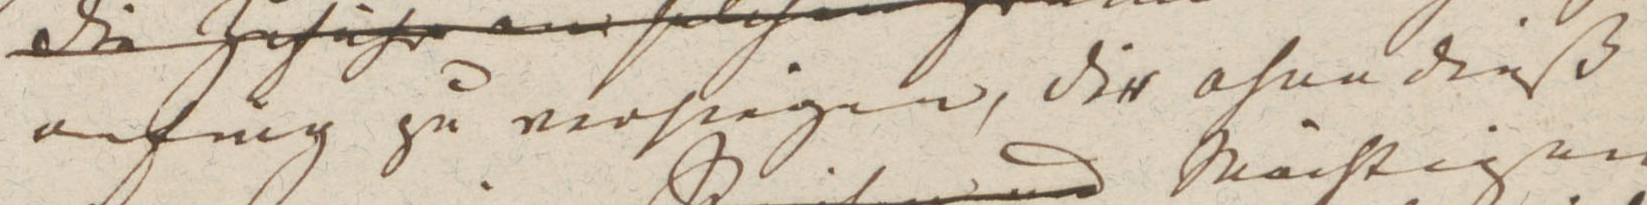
anfing zu versiegen, die ohnediess
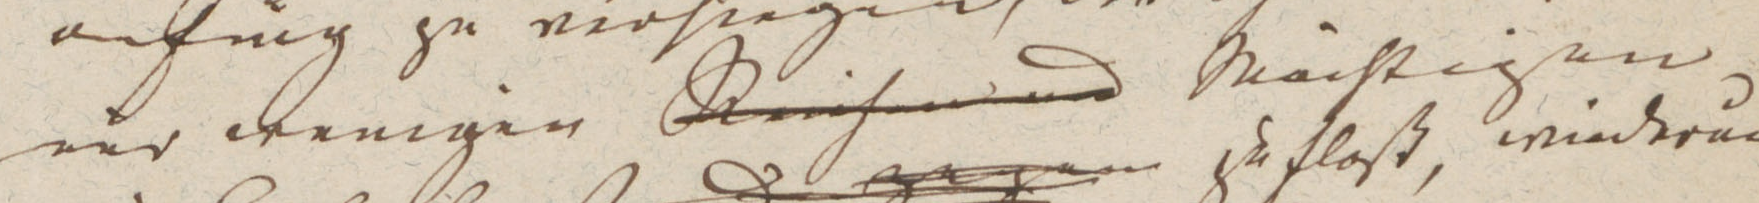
nur wenigen Reichen und Mächtigen
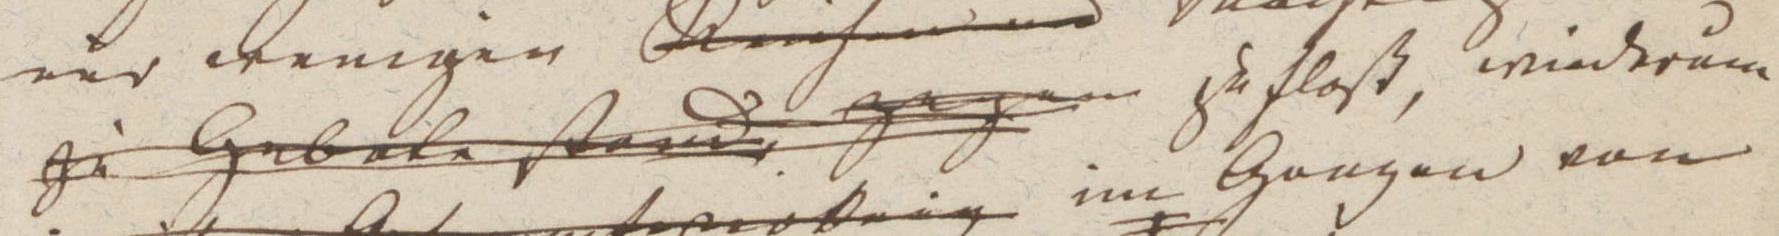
zu Gebote stand, gegen zufloss, wiederum
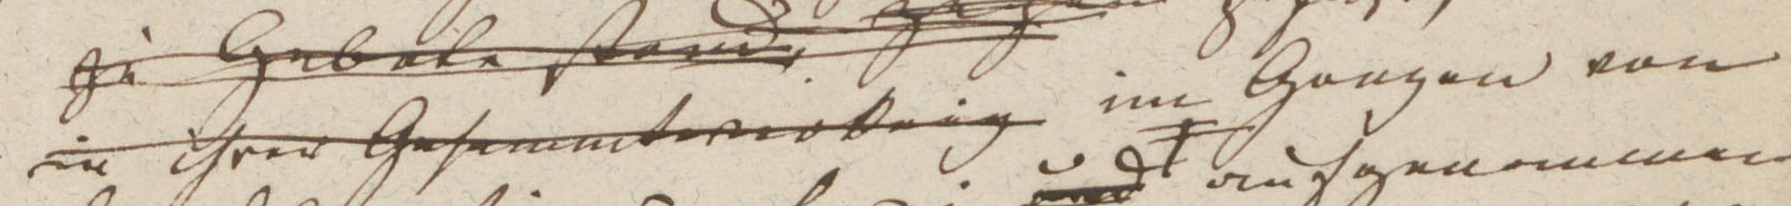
in ihrer Gesammtwirkung im Ganzen von
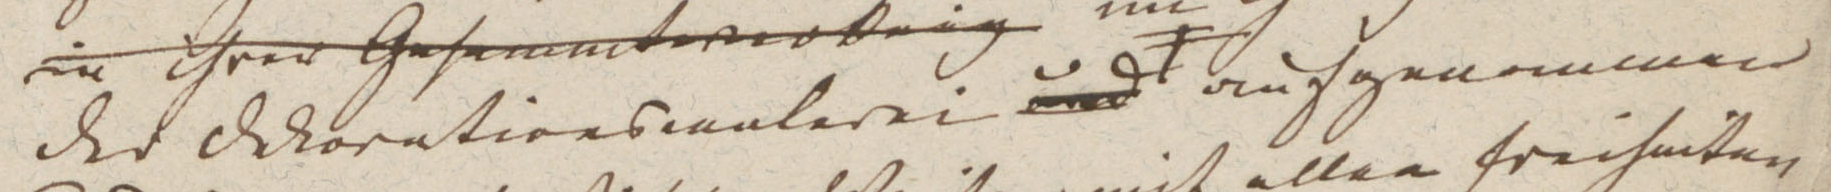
der Dekorationsmalerei und %aufgenommen
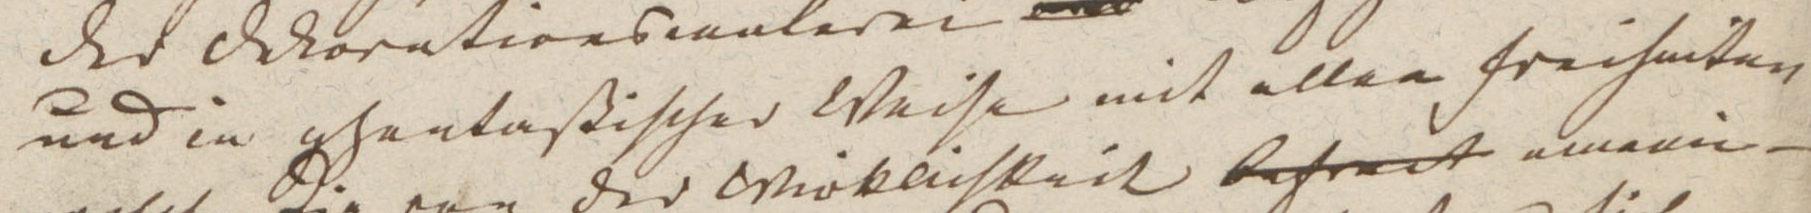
und in phantastischer Weise mit allen Freiheiten
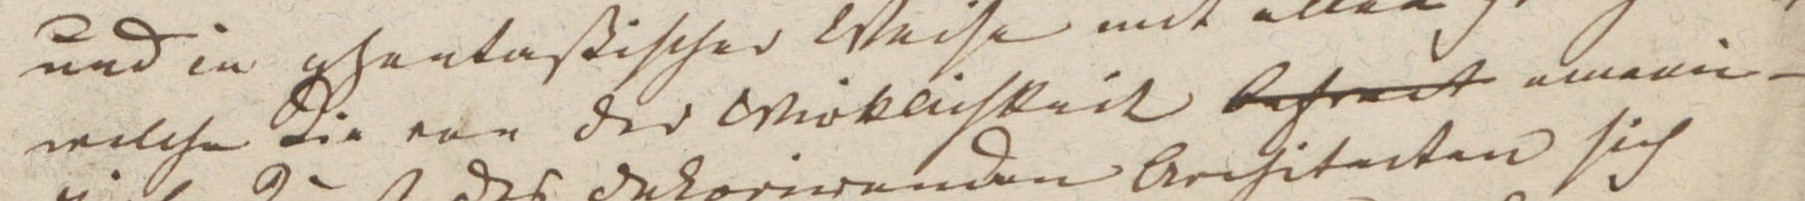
welche die von der Wirklichkeit befreit emanci-
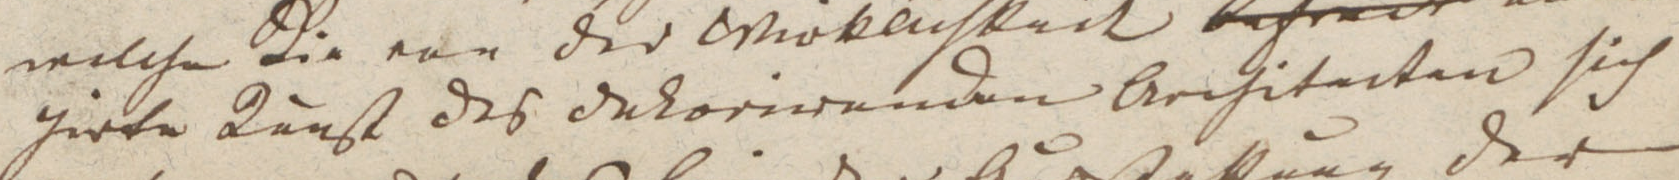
pirte Kunst des dekorirenden Architecten sich
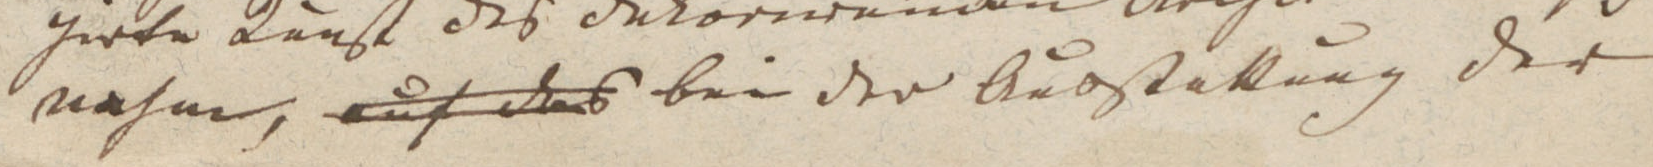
nahm, auf das bei der Ausstattung der
